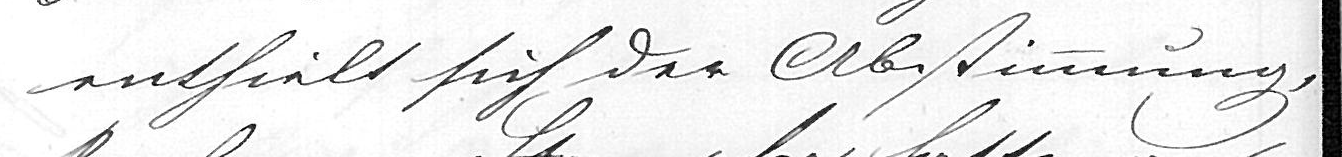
enthielt sich der Abstimmung,
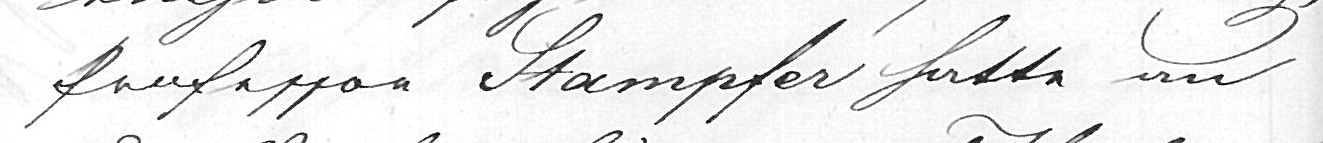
Professor Stampfer hatte an
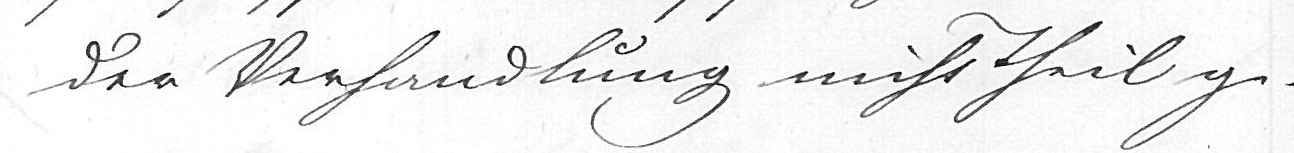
der Verhandlung mich Theil ge-
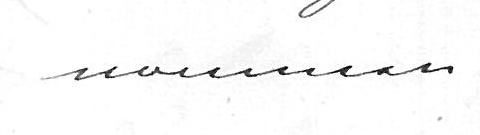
nommen.
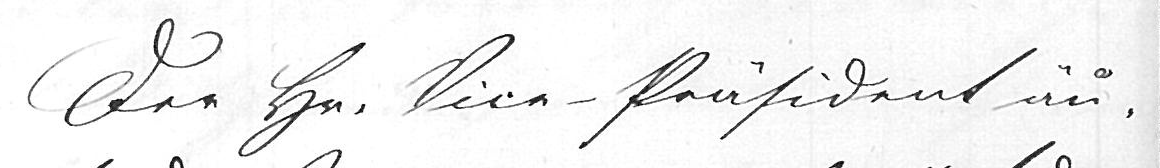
Der Hr. Vice-Präsident äu-
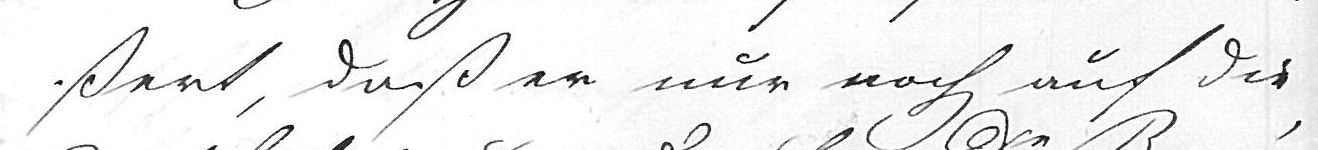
ßert, daß er nur noch auf die
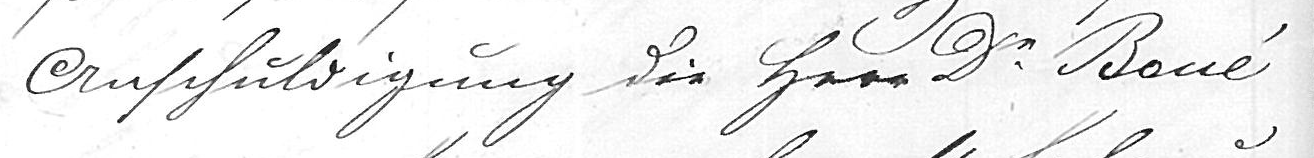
Anschuldigung die Herr Dr Boué
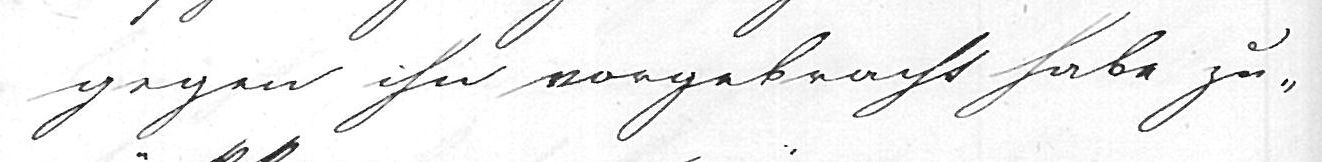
gegen ihn vorgebracht habe zu-
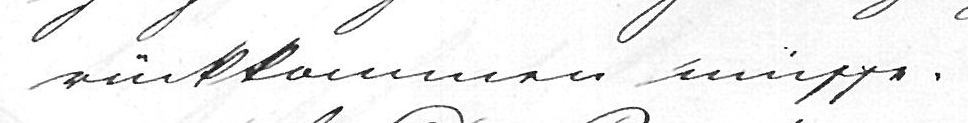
rückkommen müsse.
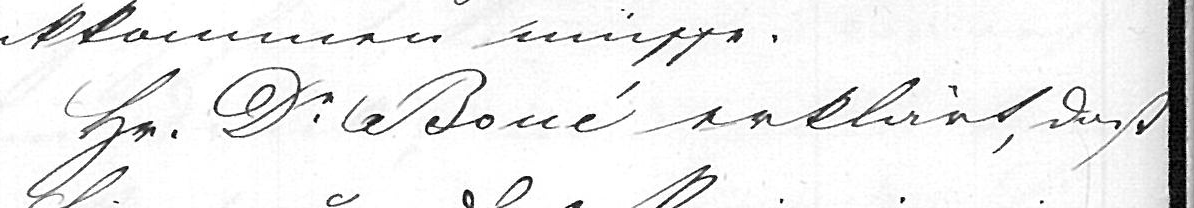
Hr. Dr Boué erklärt, daß
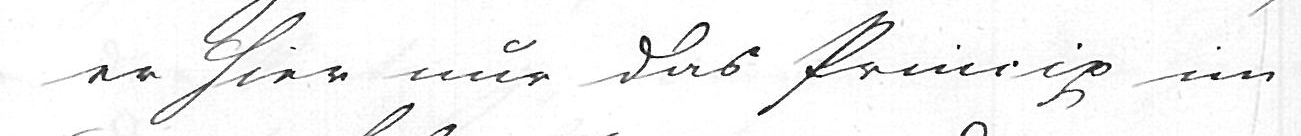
er hier nur das Princip im
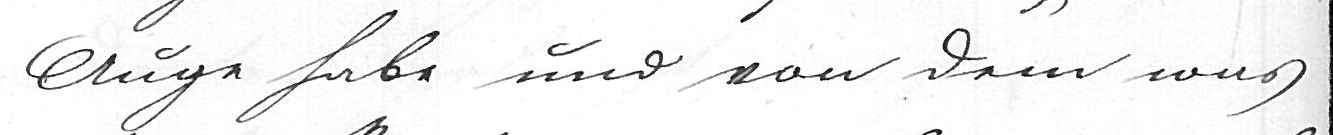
Auge habe und von dem was
